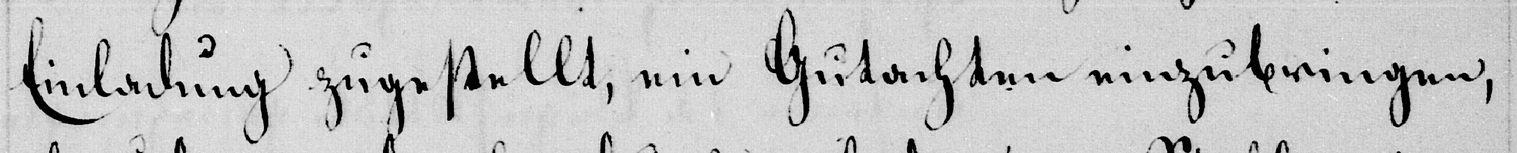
Einladung zugestellt, ein Gutachten einzubringen,
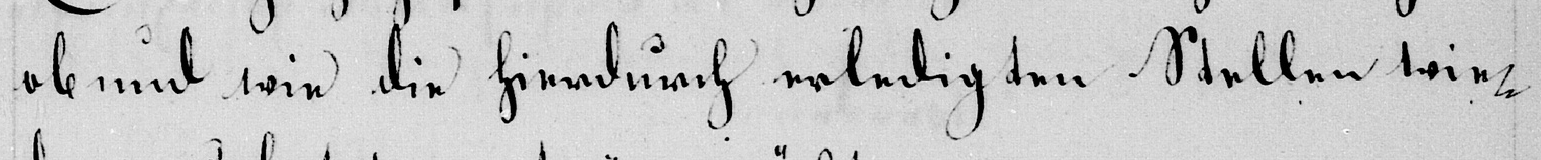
ob und wie die hierdurch erledigten Stellen wie¬
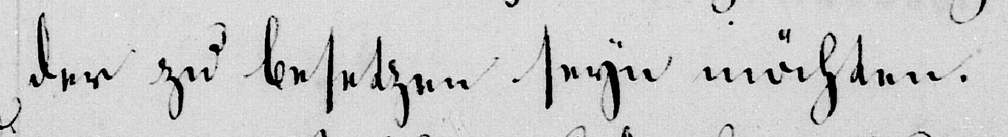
der zu besetzen seyn möchten.
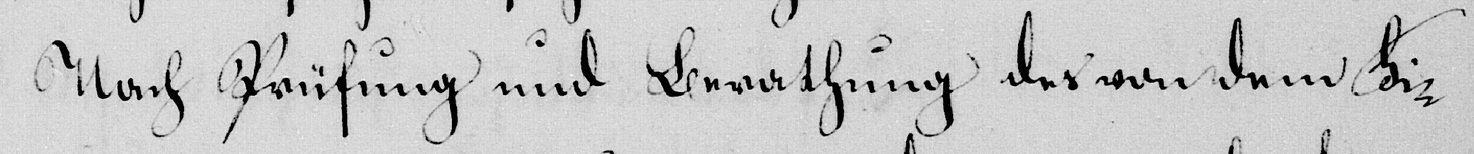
Nach Prüfung und Berathung des von dem Fi¬
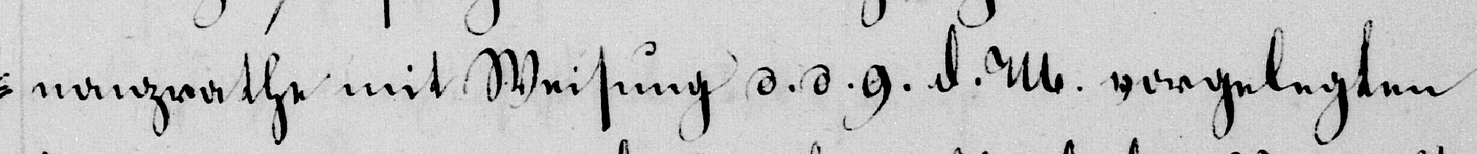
nanzrathe mit Weisung d. d. 9. d. M. vorgelegten
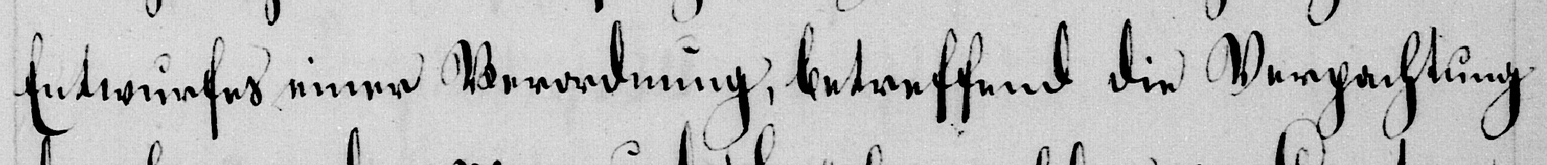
Entwurfes einer Verordnung, betreffend die Verpachtung
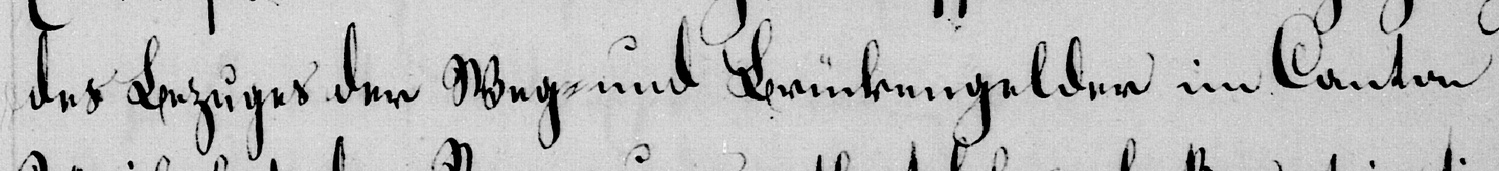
des Bezuges der Weg- und Brückengelder im Canton
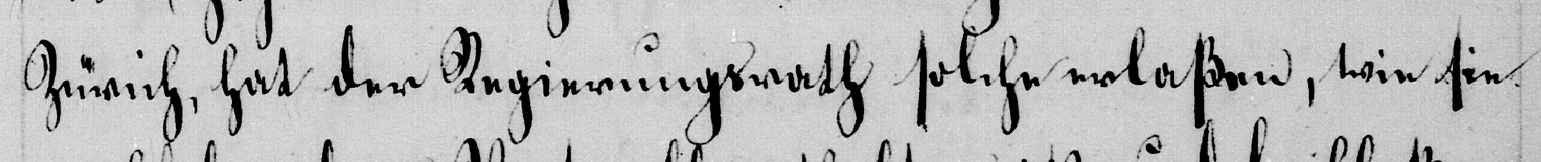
Zürich, hat der Regierungsrath solche erlaßen, wie sie
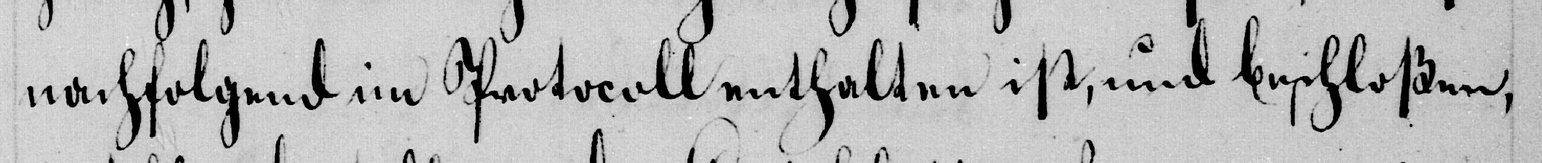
nachfolgend im Protocoll enthalten ist, und beschloßen,
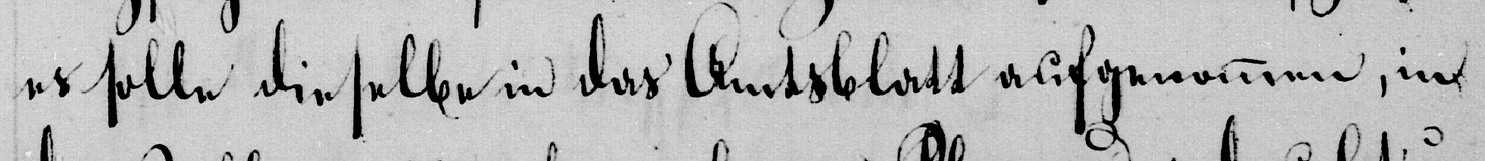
es solle dieselbe in das Amtsblatt aufgenommen, in
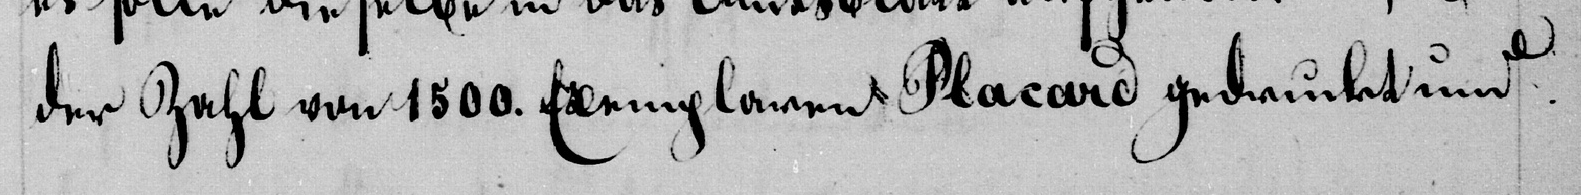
der Zahl von 1500. Exemplaren Placard gedruckt und
